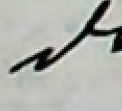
do
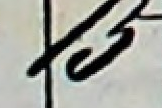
15
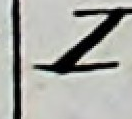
I
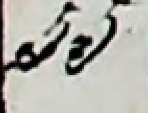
55
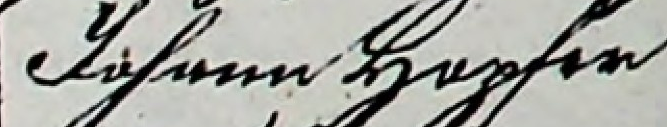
Johann Hofer
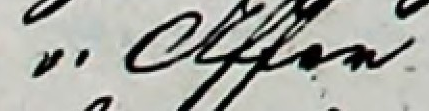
v. Affer
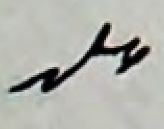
do
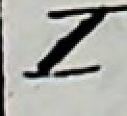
I
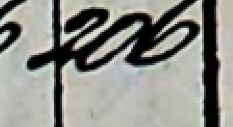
206
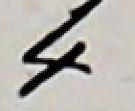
4
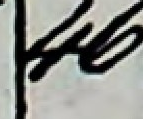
46
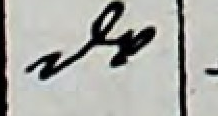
do
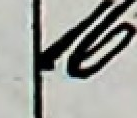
16
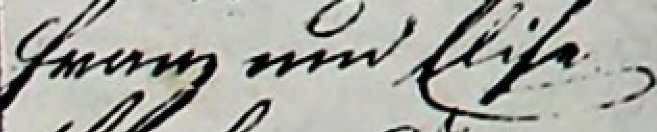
Franz und Elise
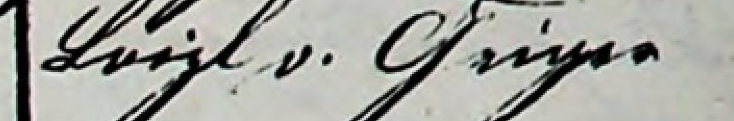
Loizl v. Geiger
